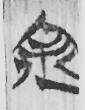余
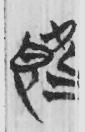既
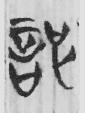䛊
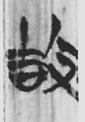{吉攴}
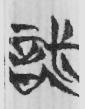䛑
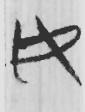女
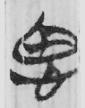思
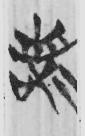若
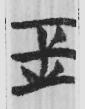玉
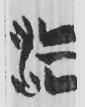冰
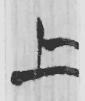上
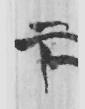下
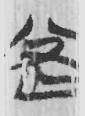罔
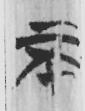不
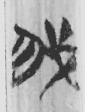我
